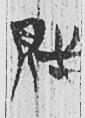{弋貝}
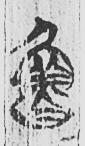魯
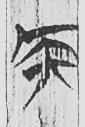侯
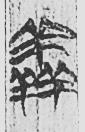羴
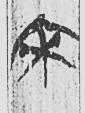宋
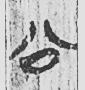公
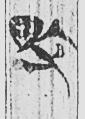畋
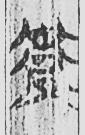衛
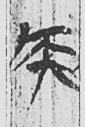侯
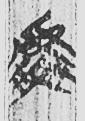虔
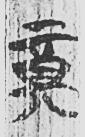奠
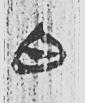白
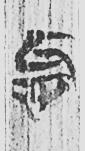怠
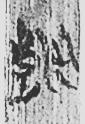朝
